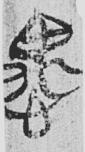愚
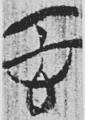○（恐）
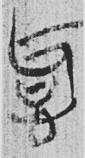怠
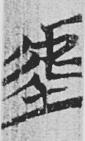○（吾）
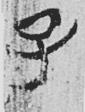子
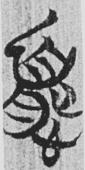○（憂）
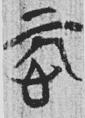○（愿）
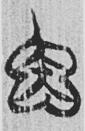○（因）
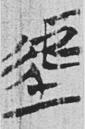○（吾）
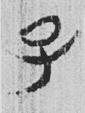子
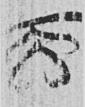而
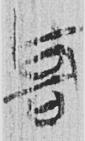○（治）
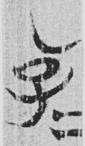孔子
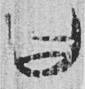曰
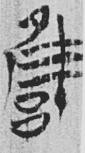雍
